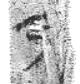月
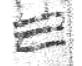己
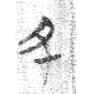丑
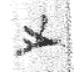之
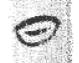日
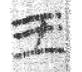王
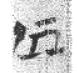凥（處）
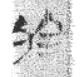於
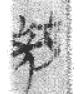𦸗
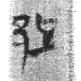郢
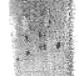之
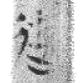遊（游）
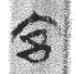宮
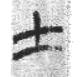士
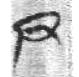尹
